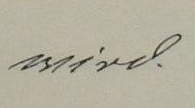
wird.
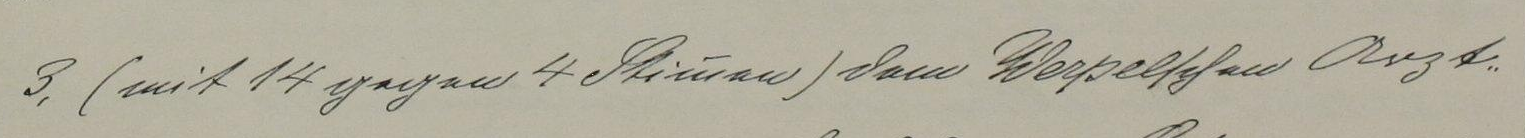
3. (mit 14 gegen 4 Stimmen) dem Werpelschen Arzt-
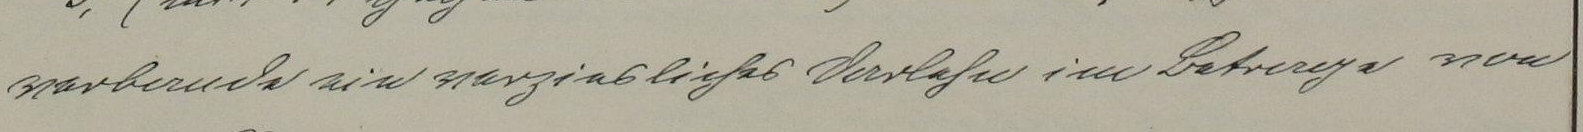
verbande ein verzinsliches Darlehn im Betrage von
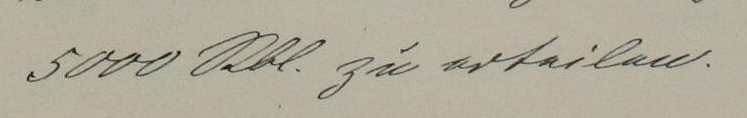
5000 Rbl. zu erteilen.
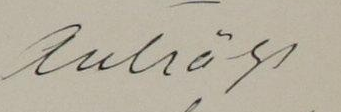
Anträge
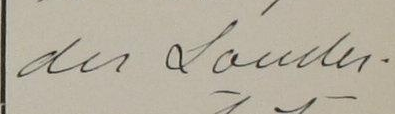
der Landes-
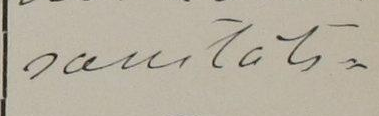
sanitäts-
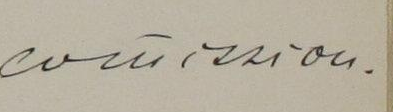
commission.
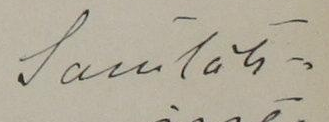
Sanitäts-
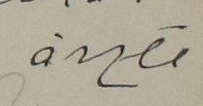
ärzte
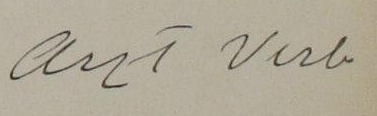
Aezt Verb
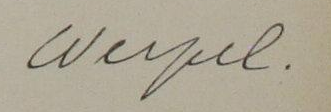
Werpel
